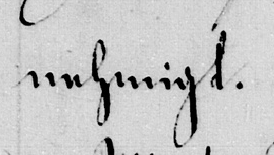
nehmigt.
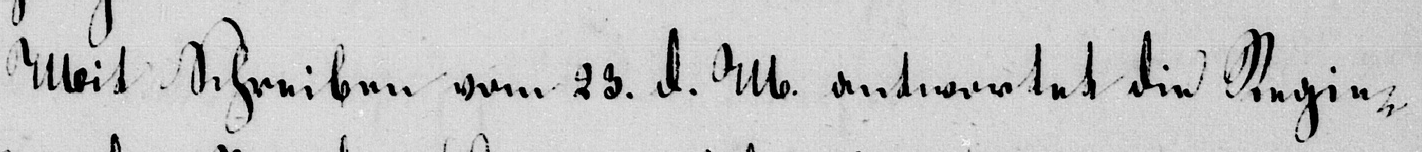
Mit Schreiben vom 23. d. M. antwortet die Regie¬
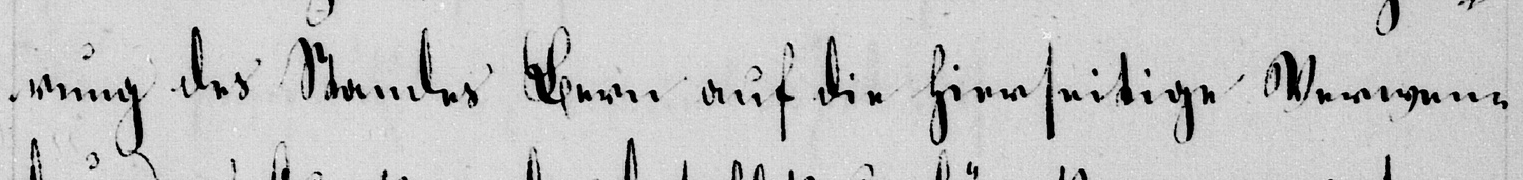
rung des Standes Bern auf die hierseitige Verwen¬
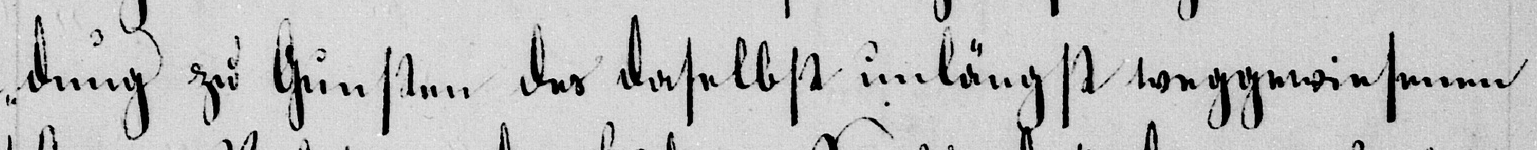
dung zu Gunsten des daselbst unlängst weggewiesenen
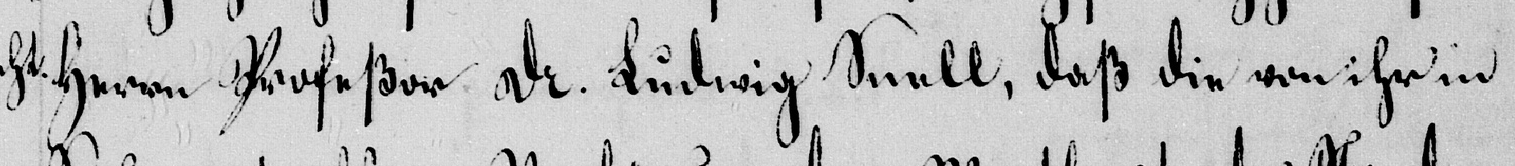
Herrn Profeßor Dr. Ludwig Snell, daß die von ihr in
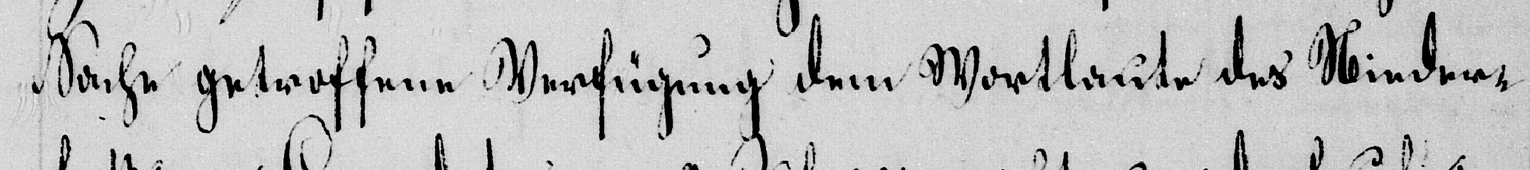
Sache getroffene Verfügung dem Wortlaute des Nieder¬
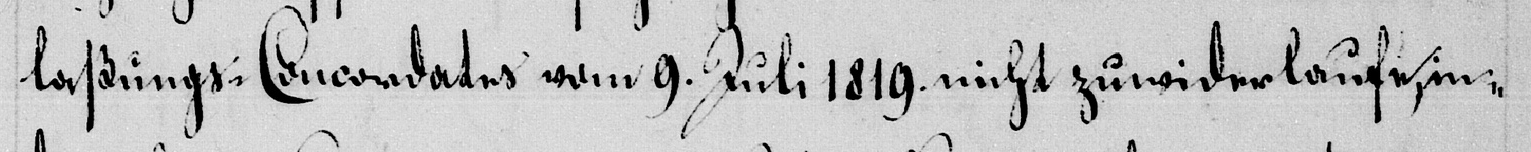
laßungs-Concordates vom 9. Juli 1819. nicht zuwider laufe, in¬
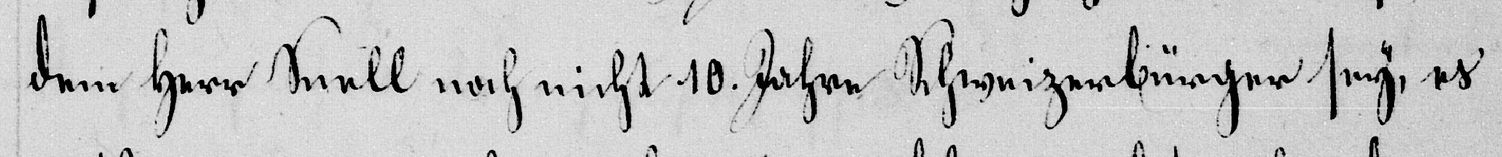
dem Herr Snell noch nicht 10. Jahre Schweizerbürger sey, es
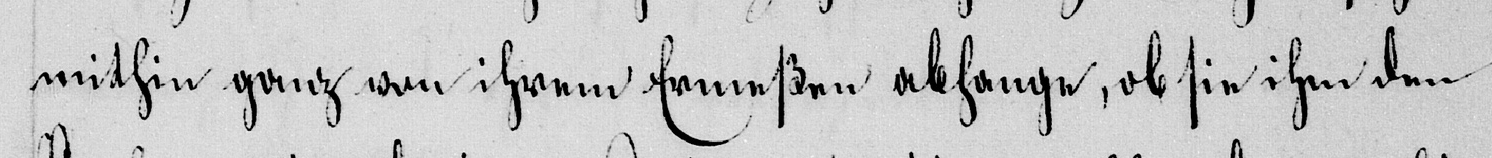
mithin ganz von ihrem Ermeßen abhange, ob sie ihm den
